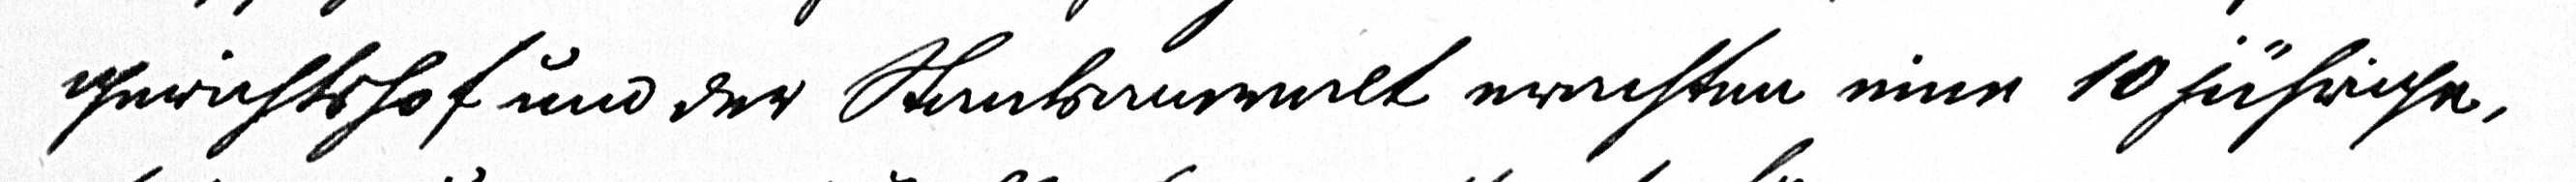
gerichtshof und der Staatsanwalt erachten eine 10 jährige,
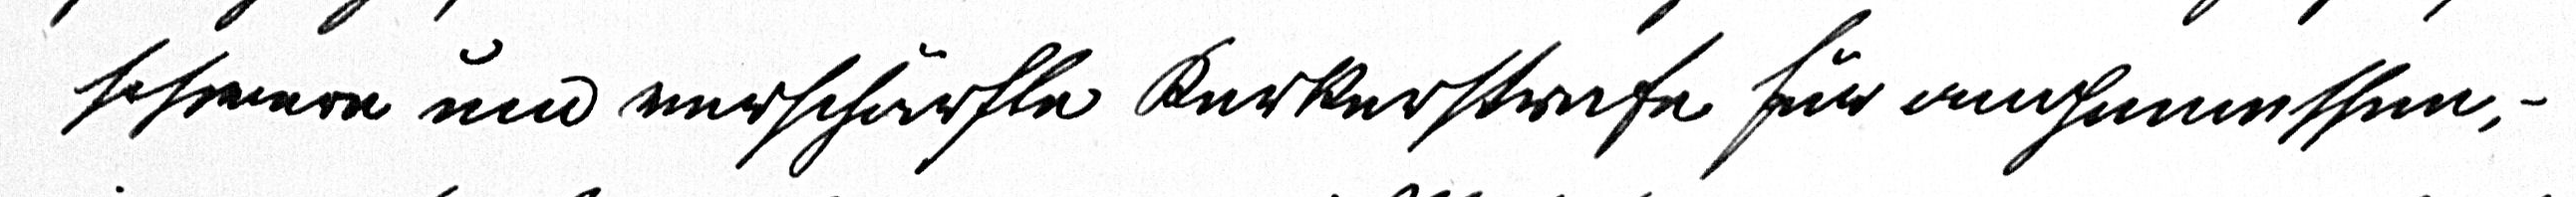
schwere und verschärfte Kerkerstrafe für angemessen, -
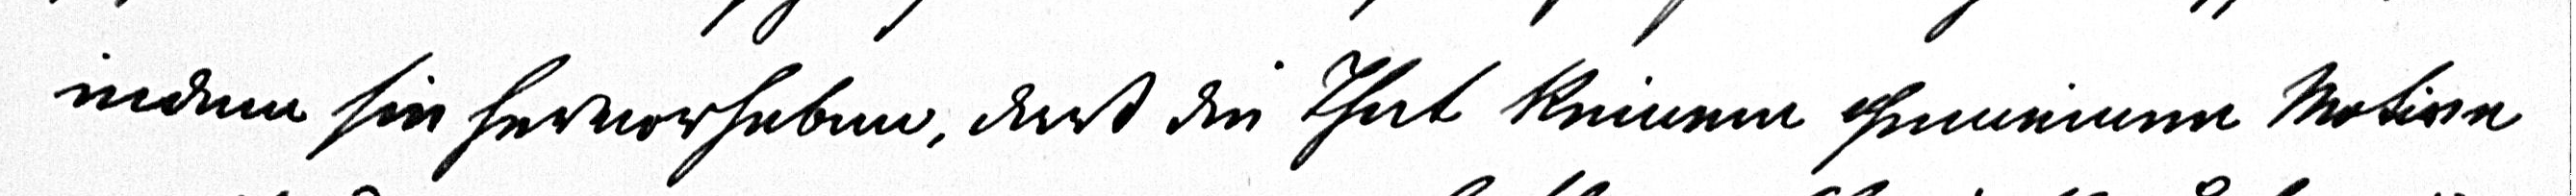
indem sie hervorheben, daß die That keinem gemeinen Motive
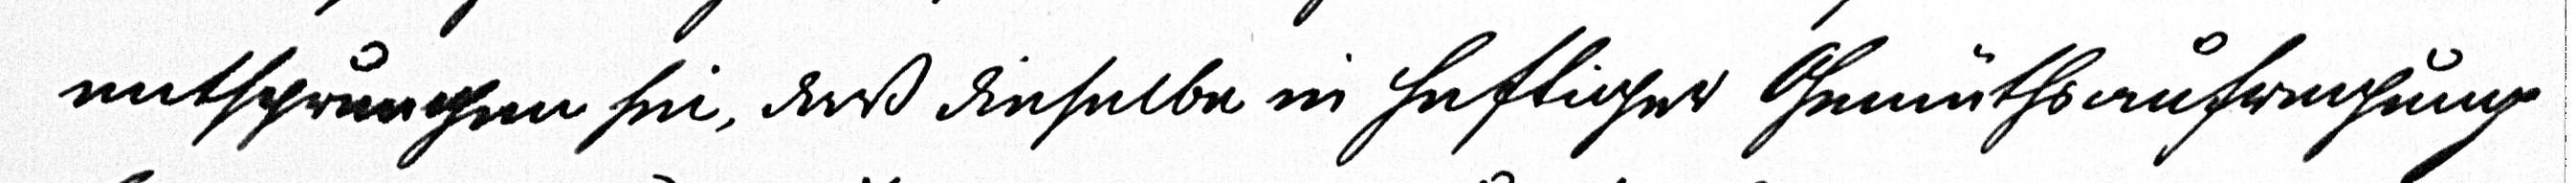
entsprungen sei, daß dieselbe in heftiger Gemüthsaufregung
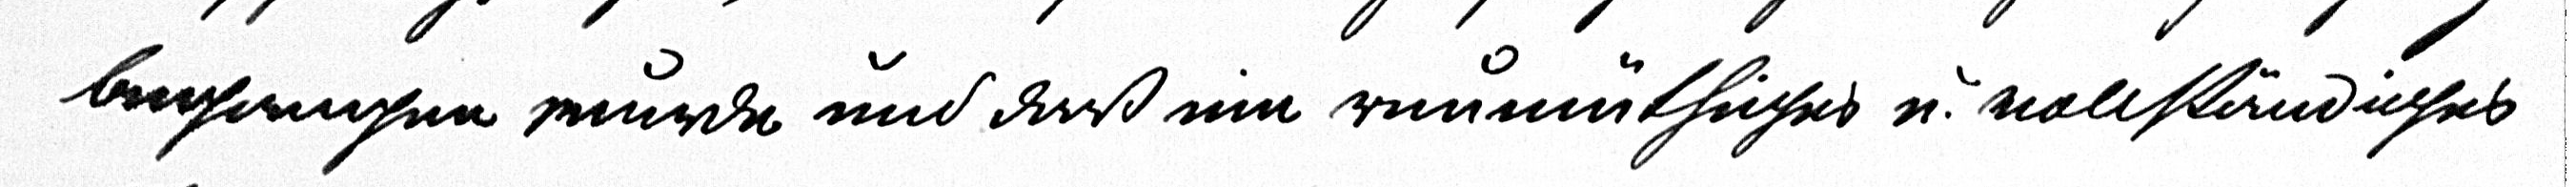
begangen wurde und daß ein reumüthiges u. vollständiges
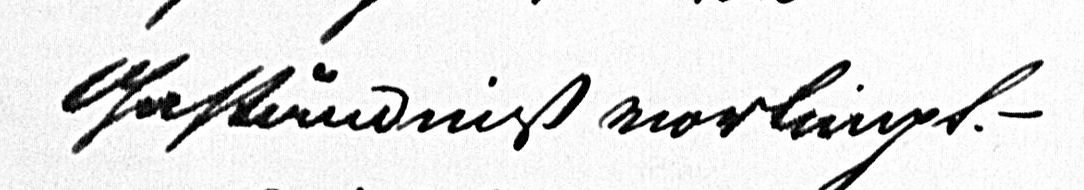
Geständnis vorliegt. -
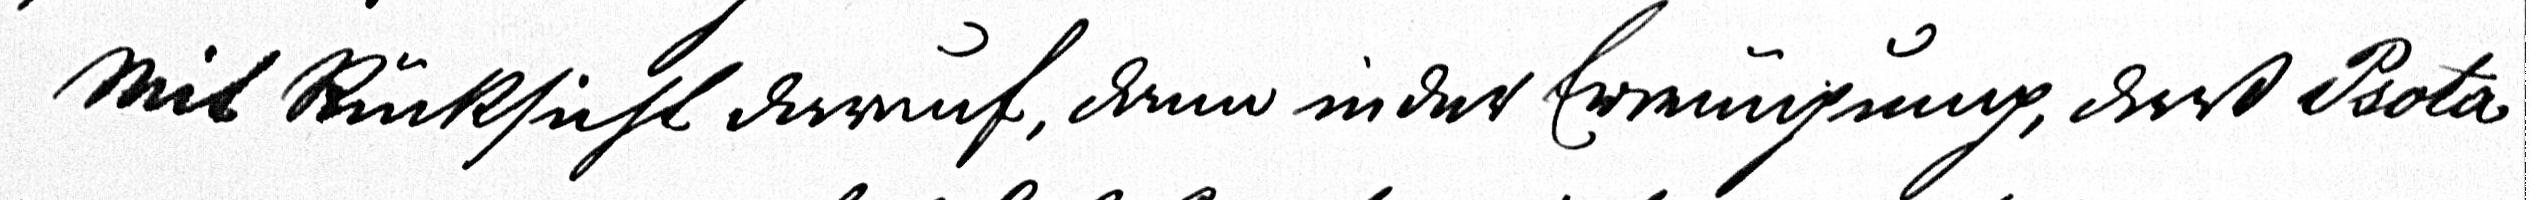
Mit Rucksicht darauf, dem in der Erwägung, daß Psota
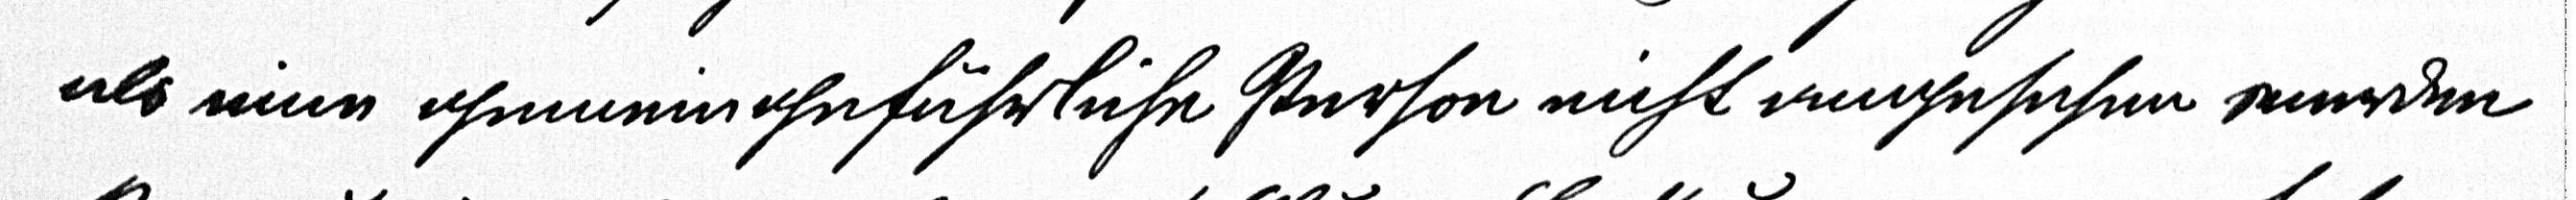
als eine gemeingefährliche Person nicht angesehen werden
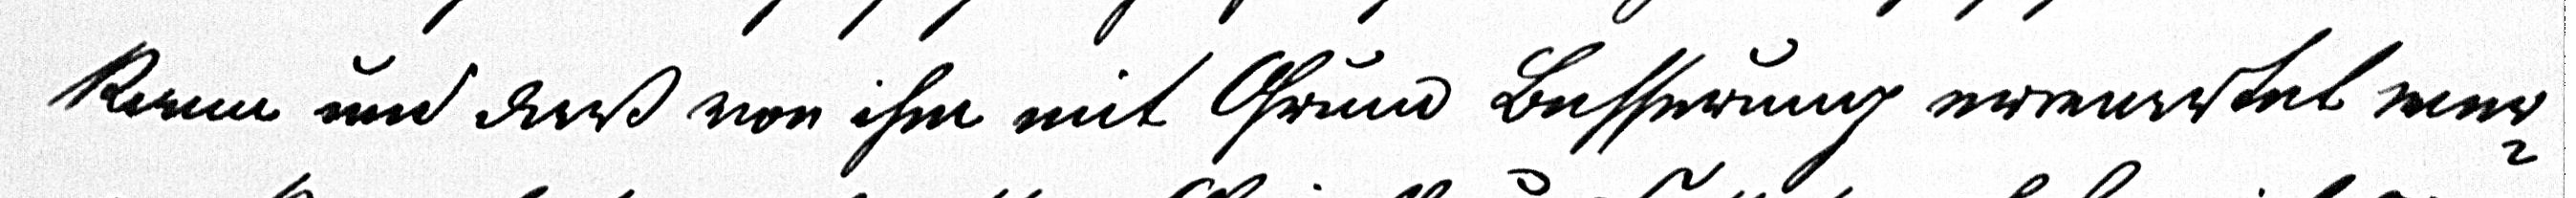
Kann und daß von ihm mit Grün Besserung erwartet wer¬
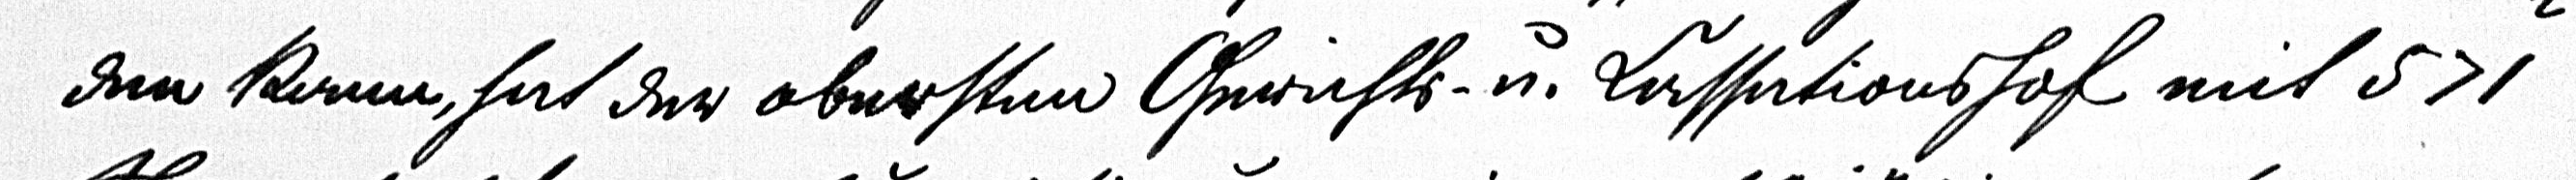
den kann, hat der obersten Gerichts- u. Cassationshof mit 571
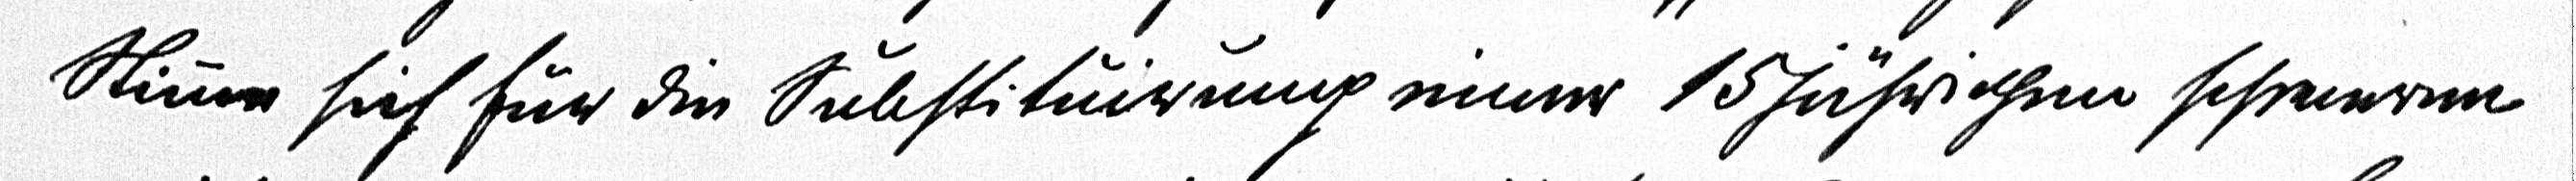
Stinnes sich für die Substituirung einer 15 jährigen schweren
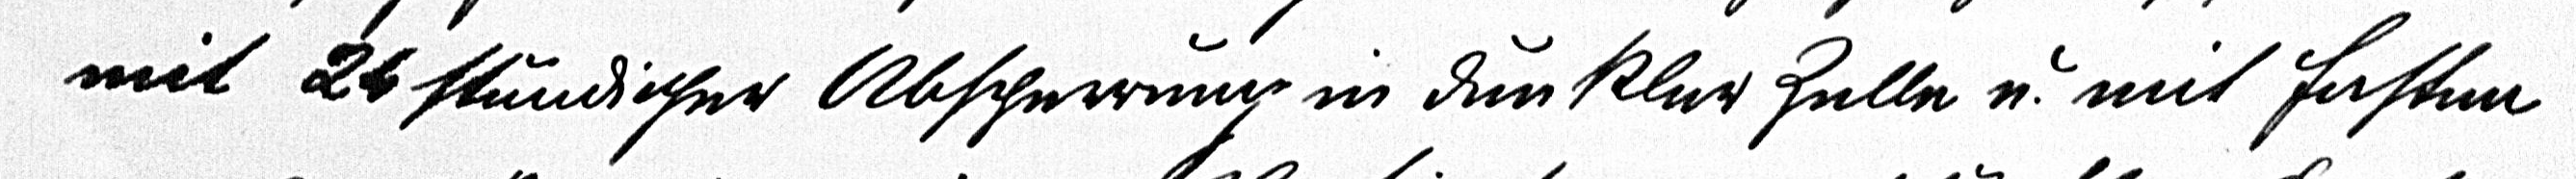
mit 24 stundiger Absperrung in dunkler Zelle u. mit fasten
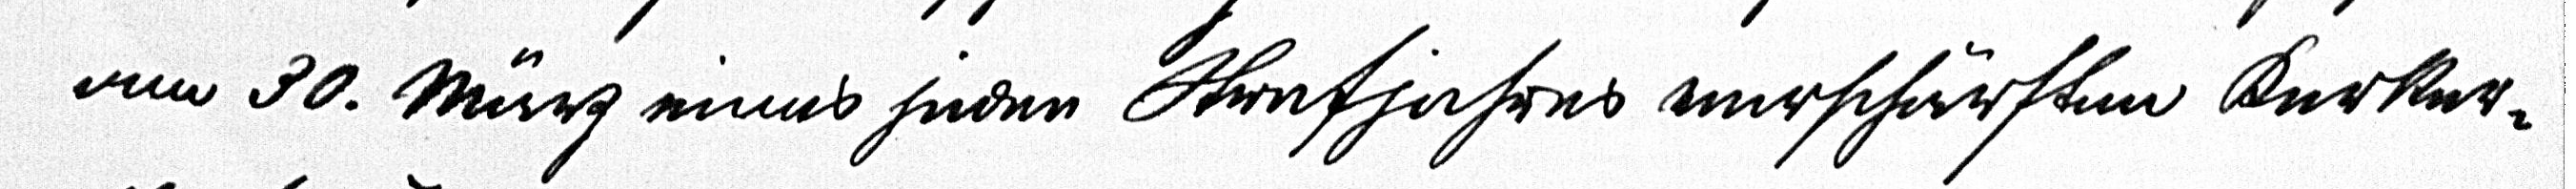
am 30. März eines jeden Strafjahres verschärften Kerker¬
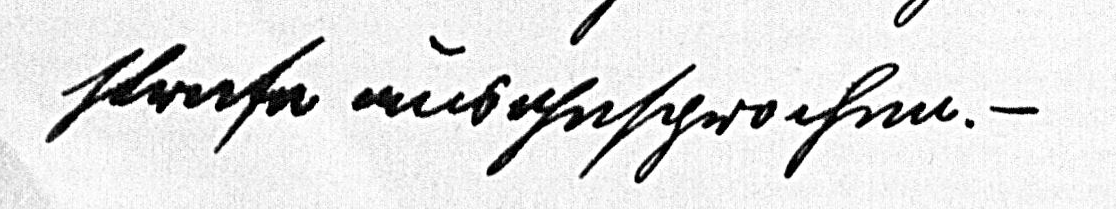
strafe ausgesprochen. -
